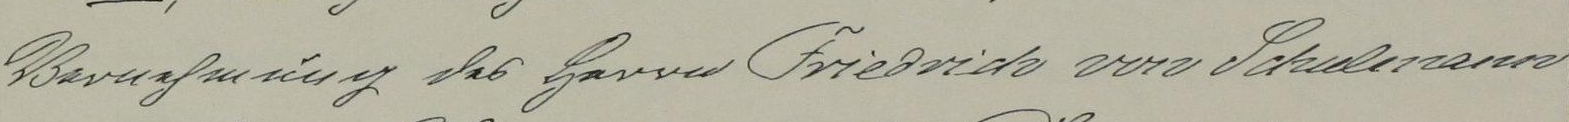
Vernehmung des Herrn Friedrich von Schulmann
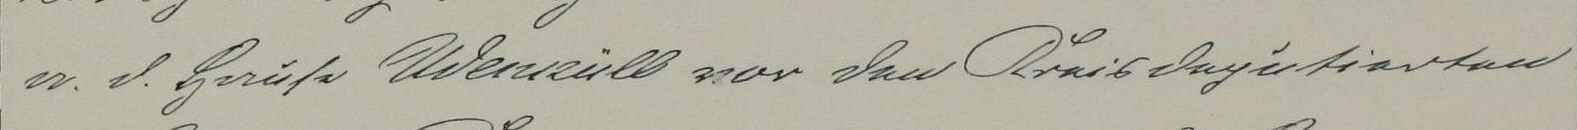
a. d. Hause Udenküll vor den Kreisdeputierten
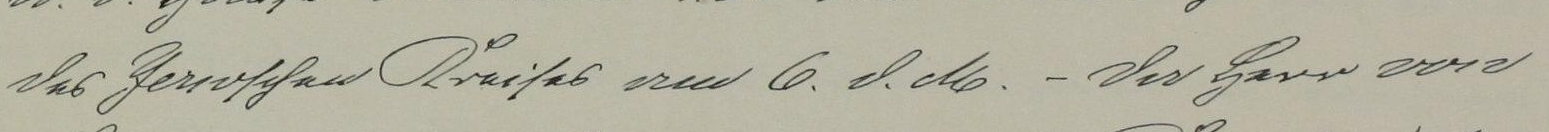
des Jerwschen Kreises am 6. d. Mo. – Da Herr von
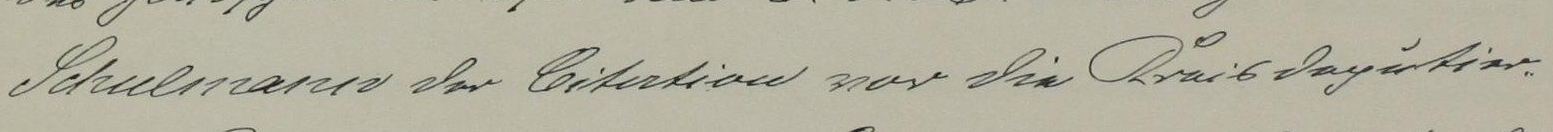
Schulmann der Citation vor die Kreisdeputier-
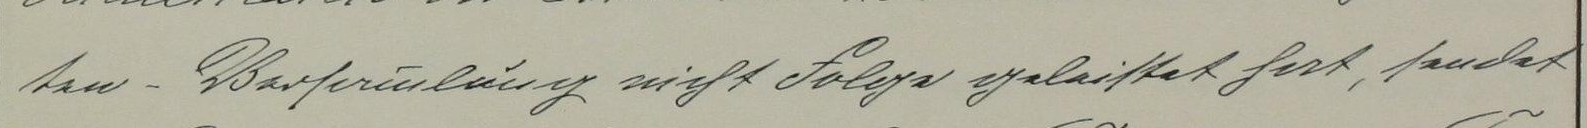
ten-Versammlung nicht Folge geleistet hat, sendet
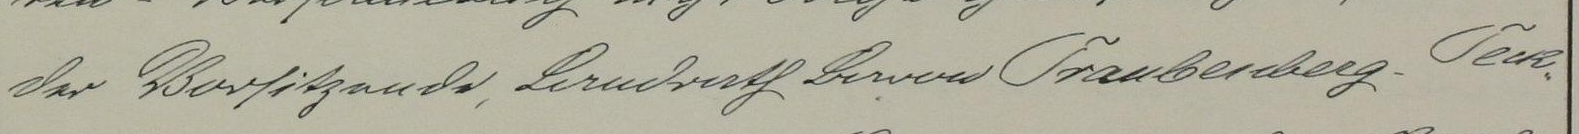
der Vorsitzende, Landrath Baron Traubenberg-Teck-
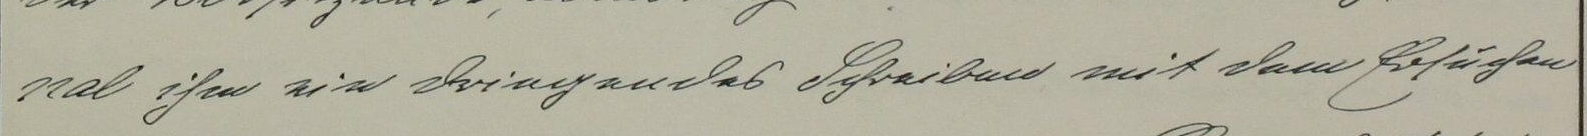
nal ihm ein dringendes Schreiben mit dem Ersuchen
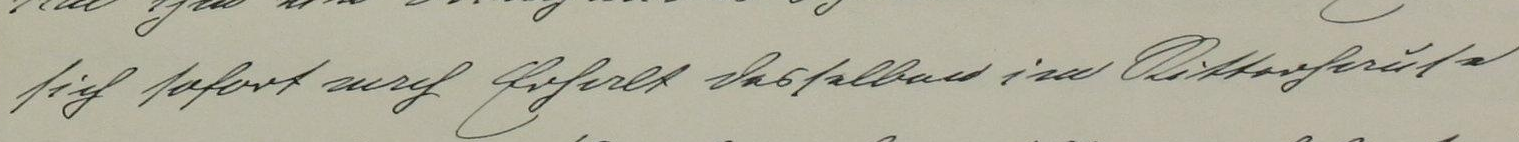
sich sofort nach Erhalt desselben im Ritterhause
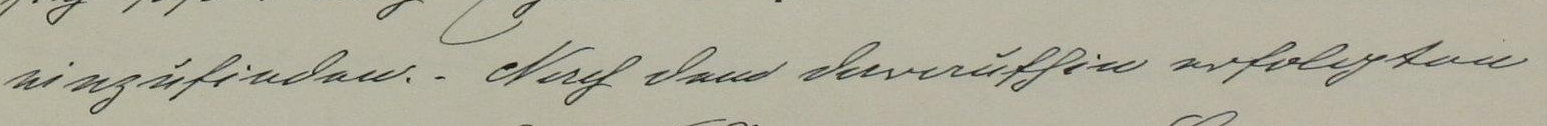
einzufinden. - Nach dem daraufhin erfolgten
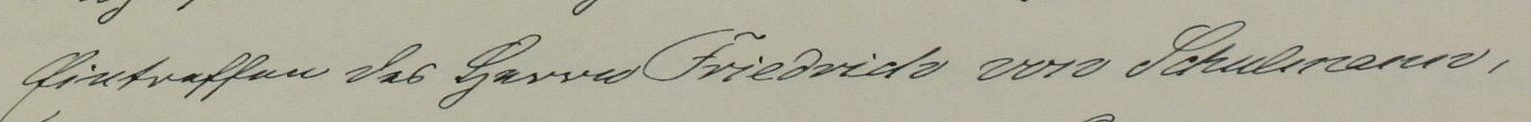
Eintreffen des Herrn Friedrich von Schulmann,
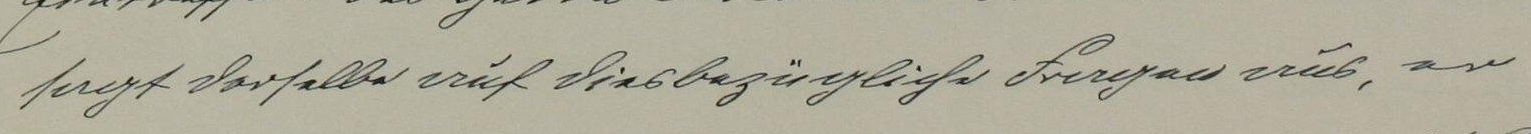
sagt derselbe auf diesbezügliche Fragen aus, er
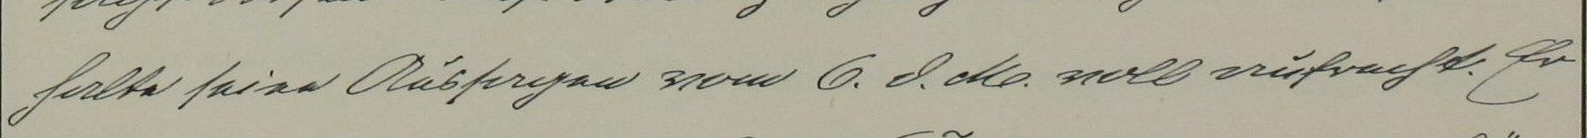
halte seine Aussagen vom 6. d. Mo. voll aufrecht. Er
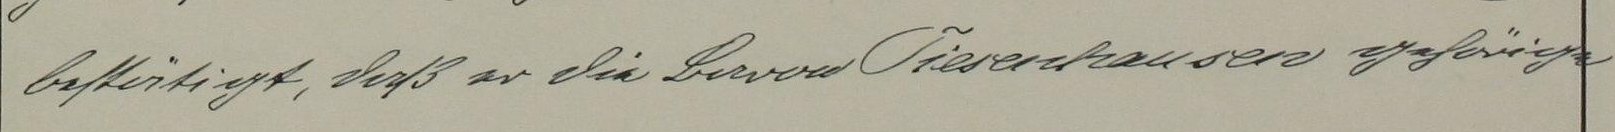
bestätigt, daß er die Baron Tiesenhausen gehörige
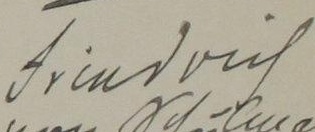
Friedrich
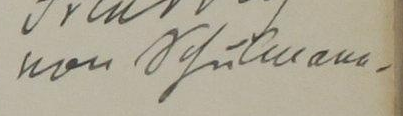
von Schulmann
